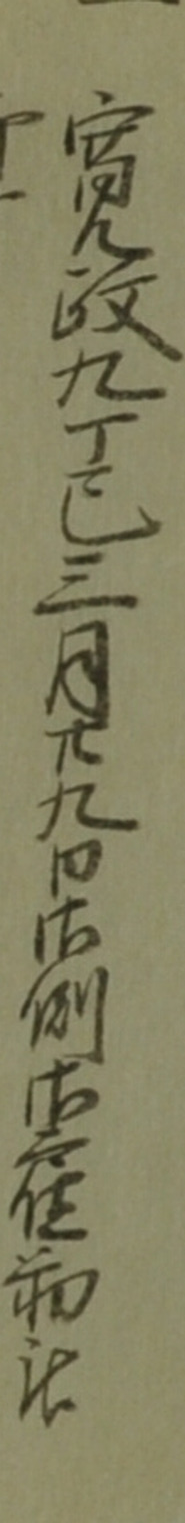一寛政九丁巳三月廿九日御側御雇被
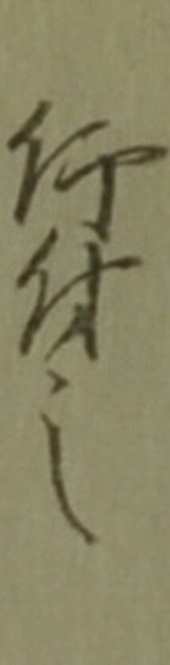仰付之
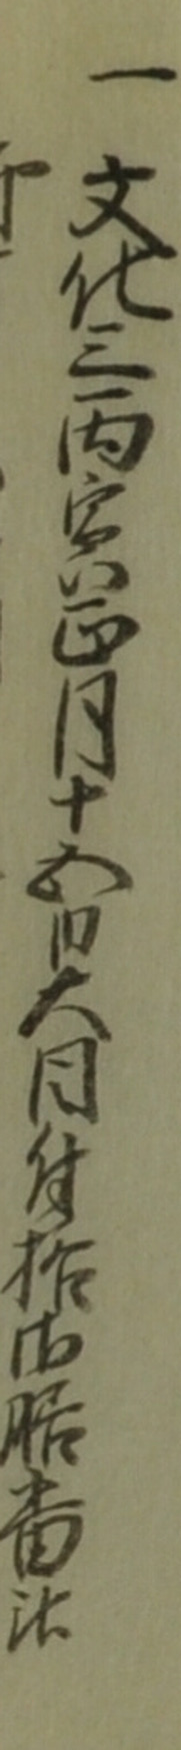一文化三丙寅正月十五日大目付格御膳番被
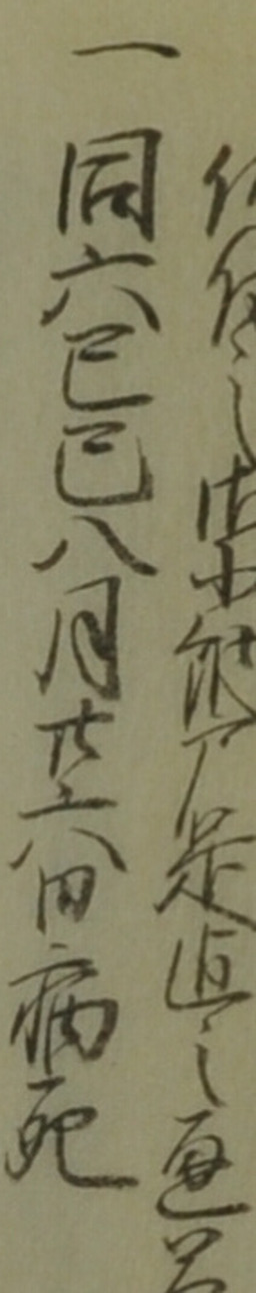一同六己巳八月廿六日病死
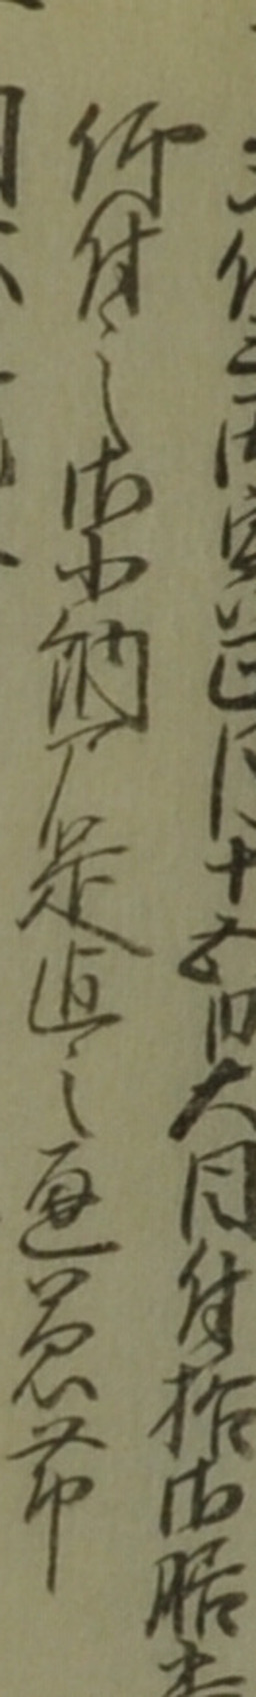仰付之御小納戸是迄之通之通兼帯
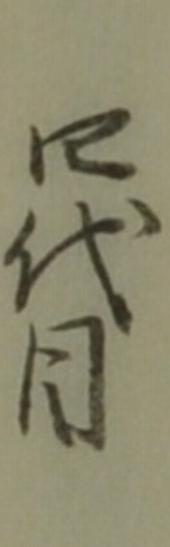四代目
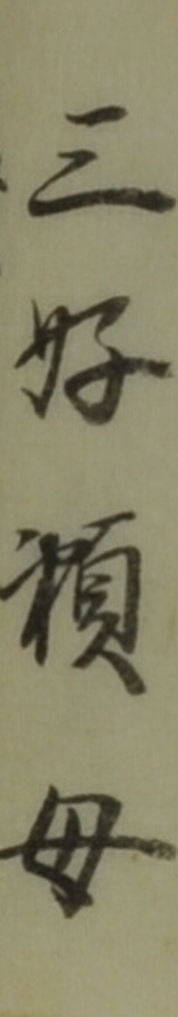三好頼母
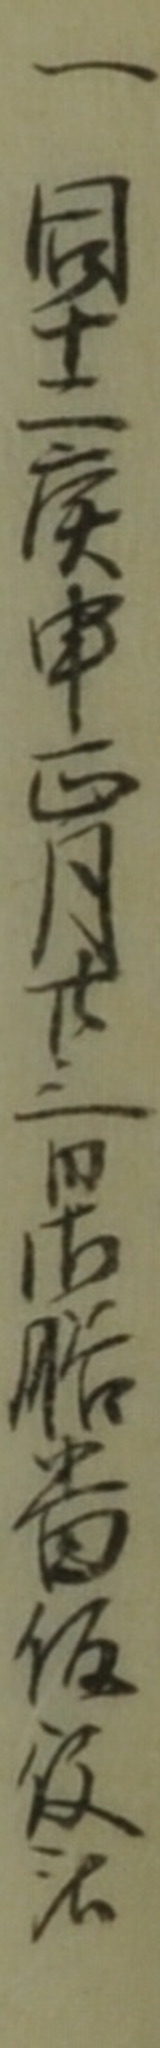一同十二庚申正月廿三日御膳番仮役被
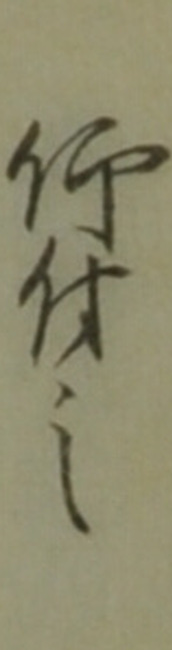仰付之
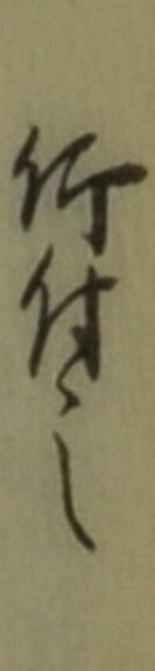仰付之
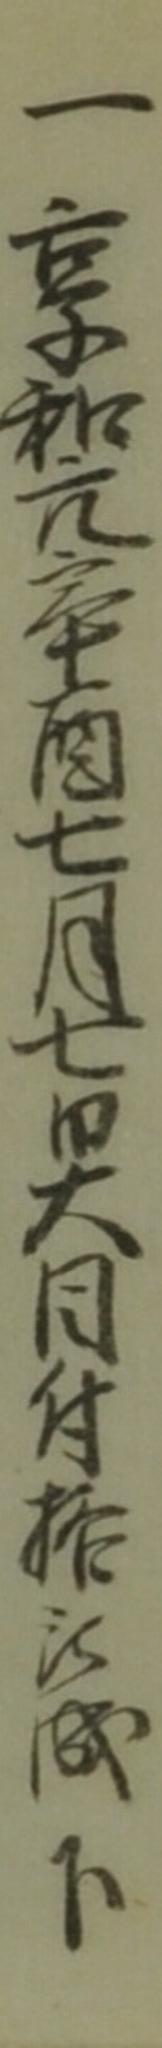一享和元辛酉七月七日大目付格被成下
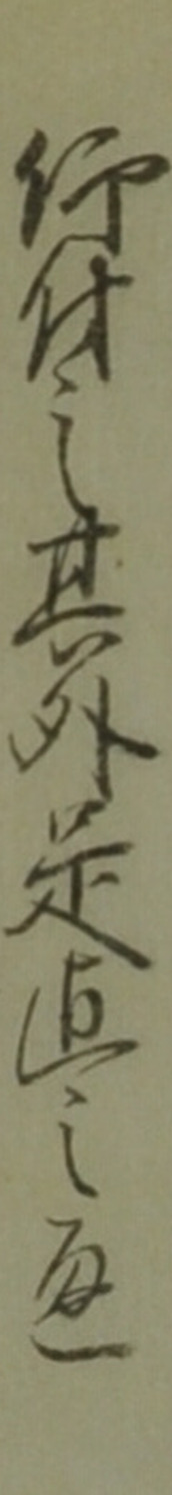仰付之其外是迄之通
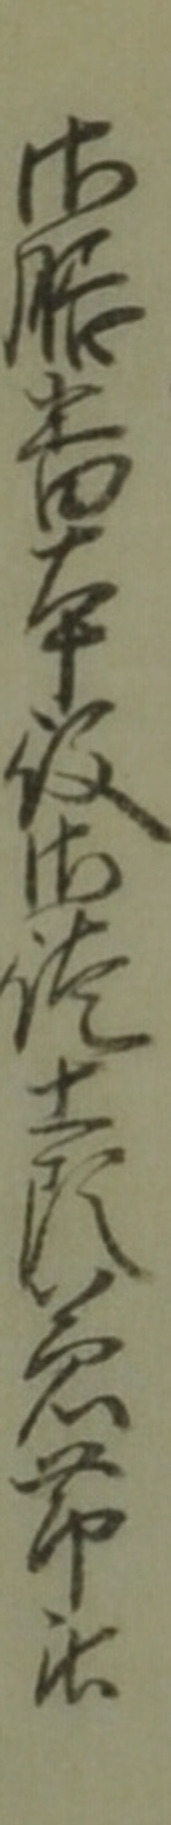御膳番本役御徒士兼帯被
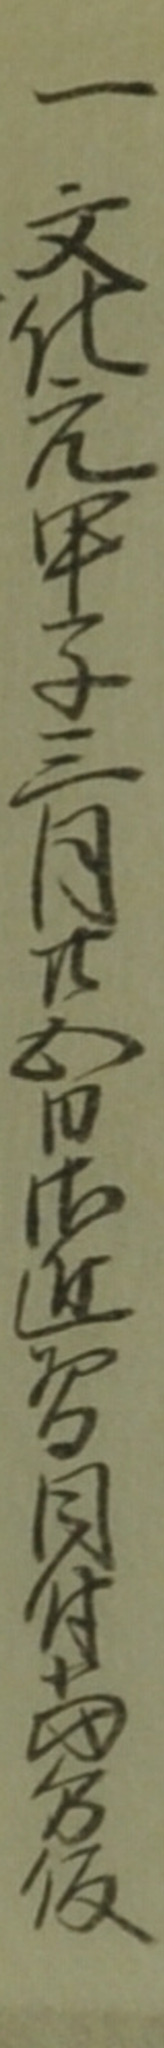一文化元甲子三月廿五日御近習目付当分仮
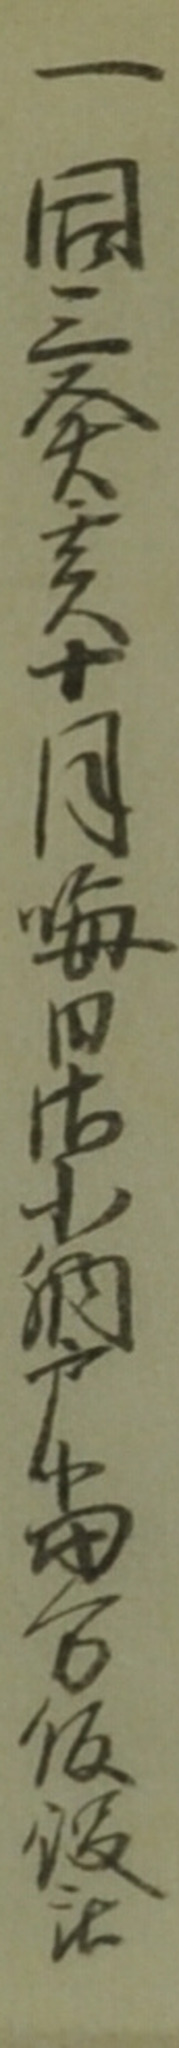一同三癸亥十月晦日御小納戸当分仮役被
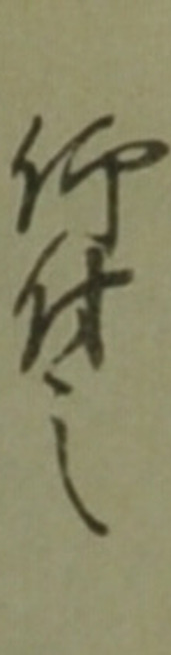仰付之
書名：諸御役代々録（五）
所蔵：伊那市立高遠町図書館・合同会社AMANE
